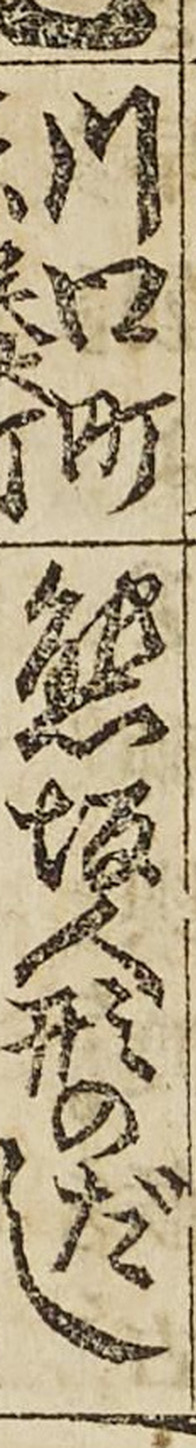九川口町熊坂人形のだし
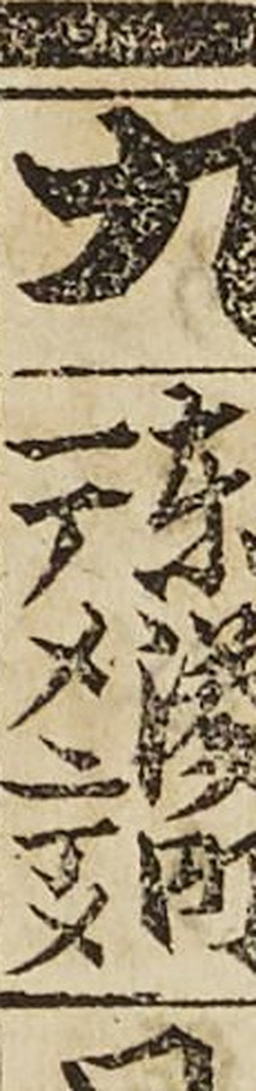一丁メ二丁メ
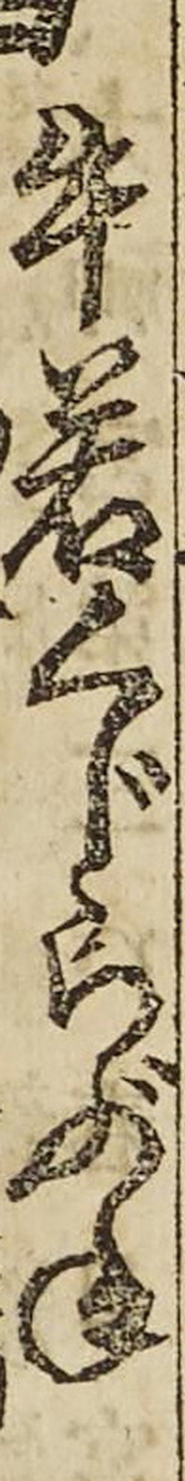番牛若くじらぶね
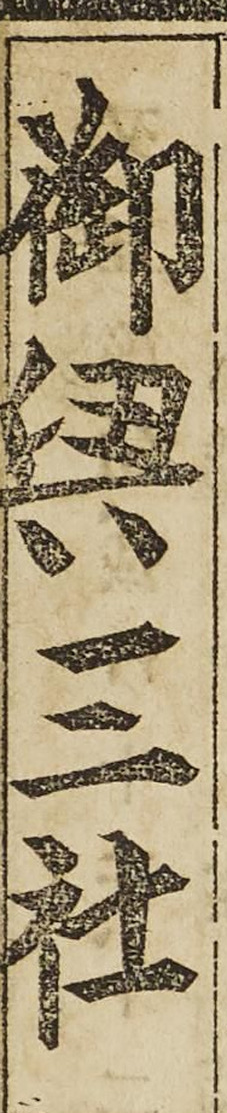御輿三社

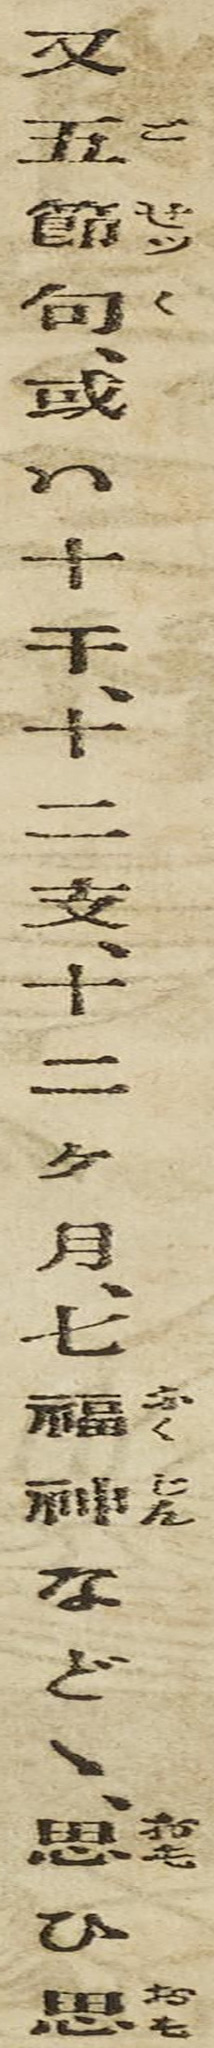又五節句、或は十干、十二支、十二ケ月、七福神などゝ、思ひ思
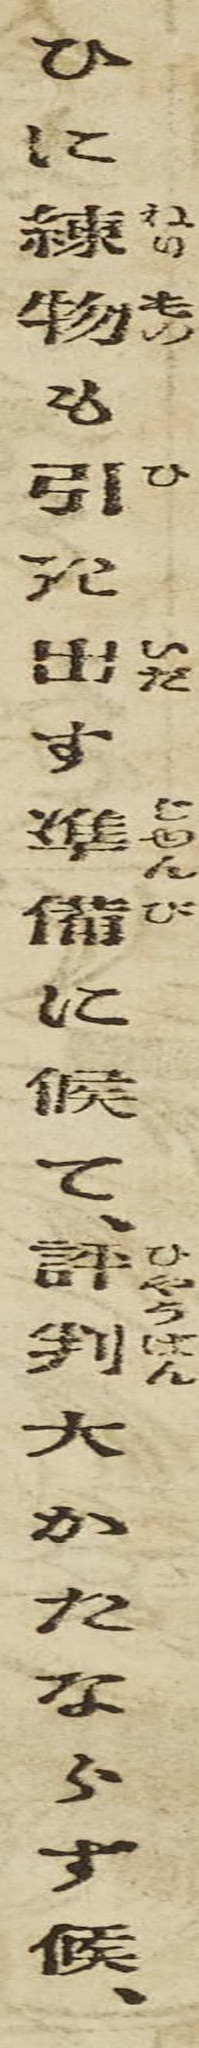ひに練物も引き出す準備に候て、評判大かたならず候、
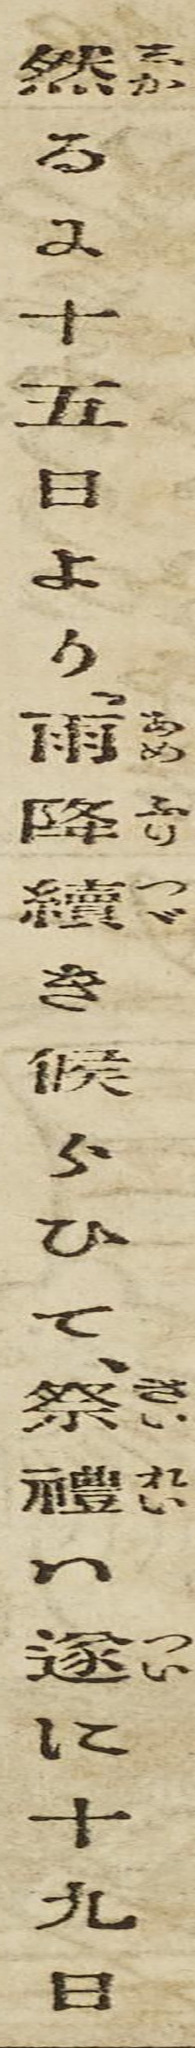然るに十五日より、雨降続き候らひて、祭礼は遂に十九日
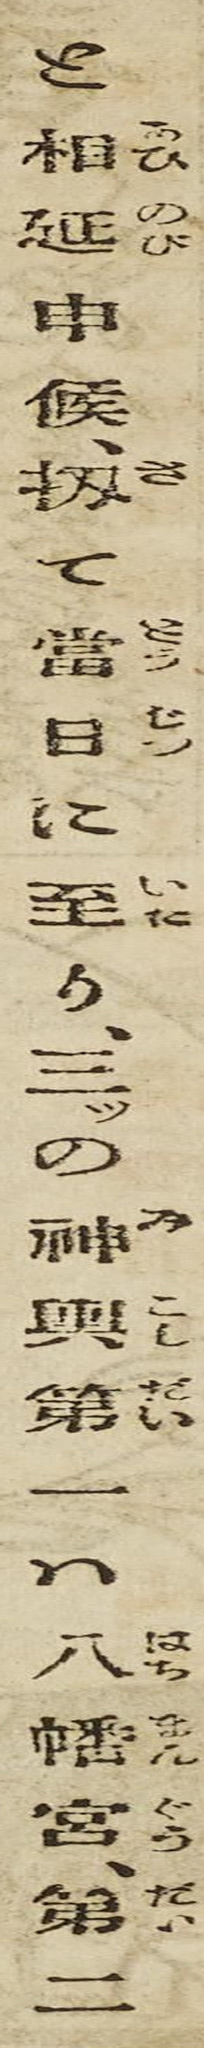と相延申候、扨て当日に至り、三神輿第一は八幡宮、第二
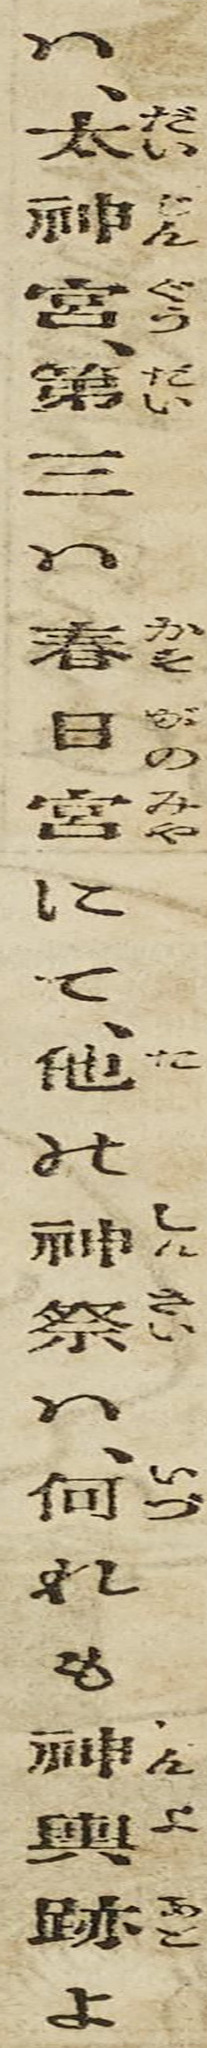は、太神宮、第三は春日宮にて、他の神祭は、何れも神輿跡よ
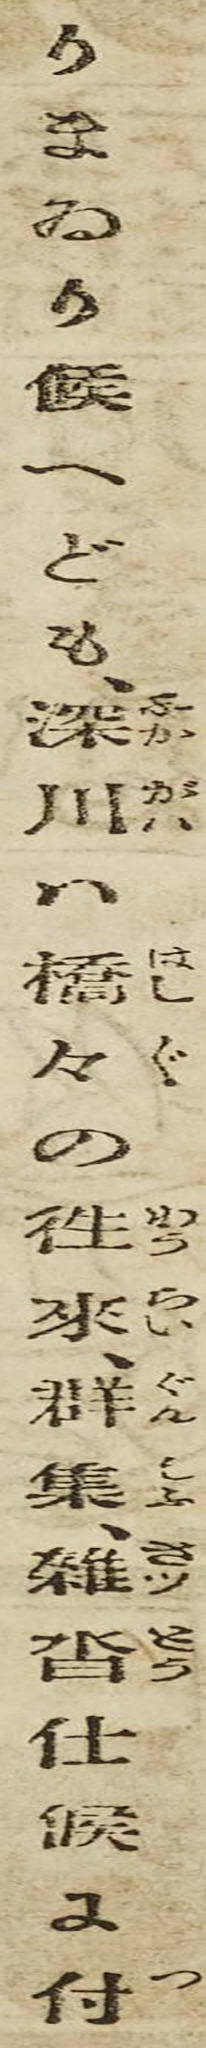りまゐり候へども、深川は橋々の往来、群集、雑沓仕候に付
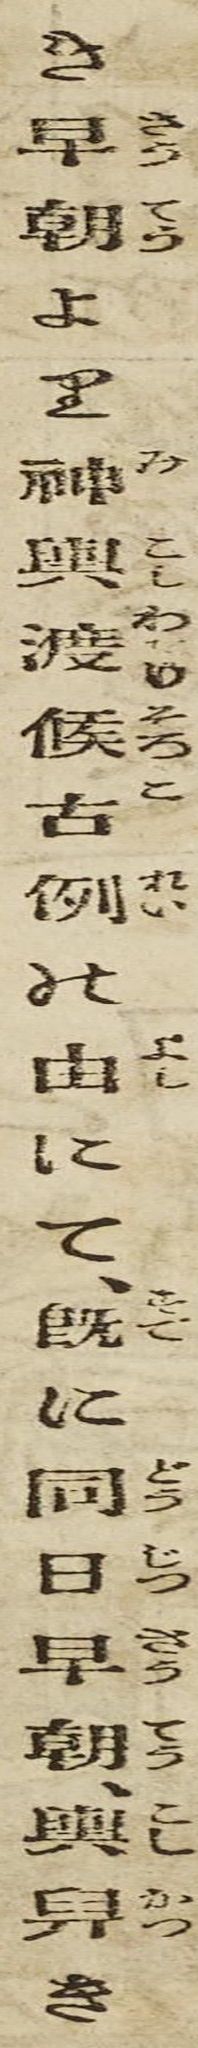き早朝より神輿渡候古例の由にて、既に同日早朝、輿舁き
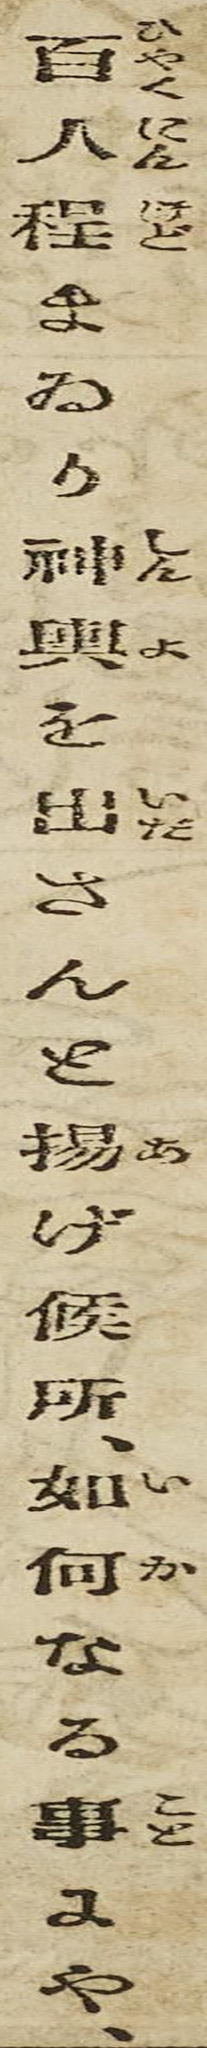百人程まゐり神輿を出さんと揚げ候所、如何なる事にや、
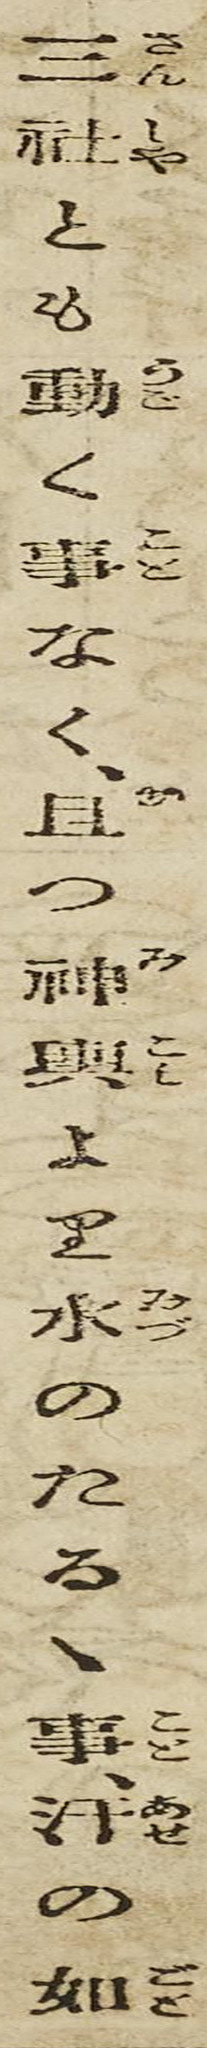三社とも動く事なく、且つ神輿より水のたるゝ事、汗の如
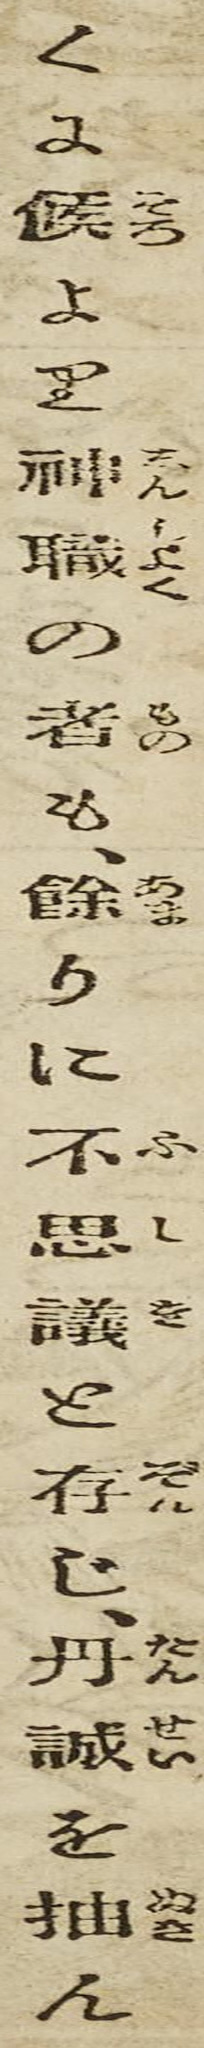くに候より神職の者も、余りに不思議と存じ、丹誠を抽ん
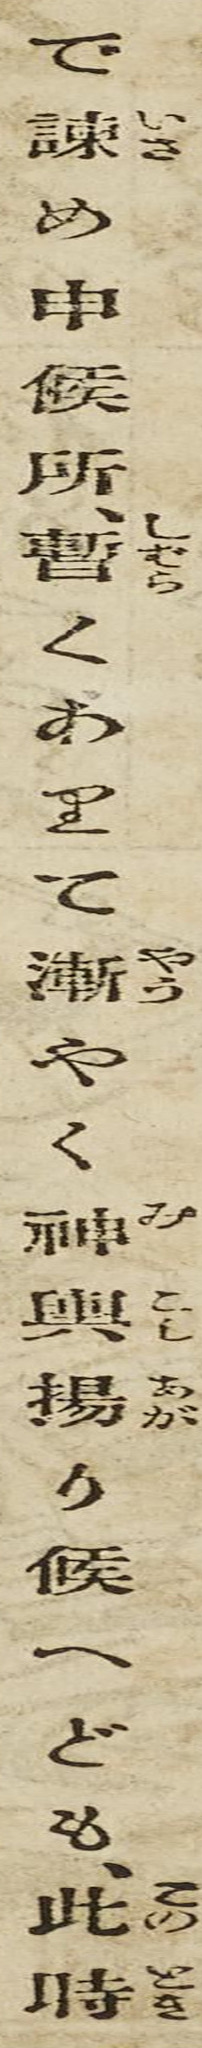で諫め申候所、暫くありて漸やく神輿揚り候へども、此時
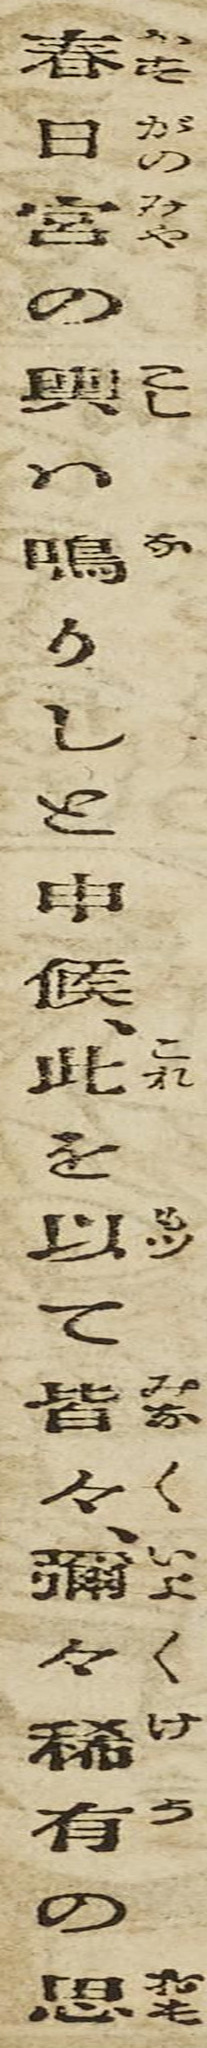春日宮の輿は鳴りしと申候、此を以て皆々、弥々稀有の思
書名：永代惨話　文化の夢　全
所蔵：東京大学地震研究所図書室 Earthquake Research Institute Library, The University of Tokyo, JAPAN
